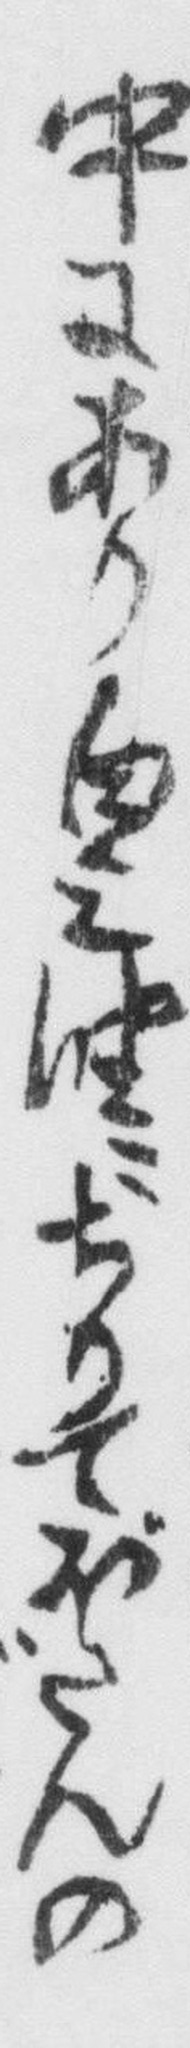中にあり白ミばちりてぼたんのごとし
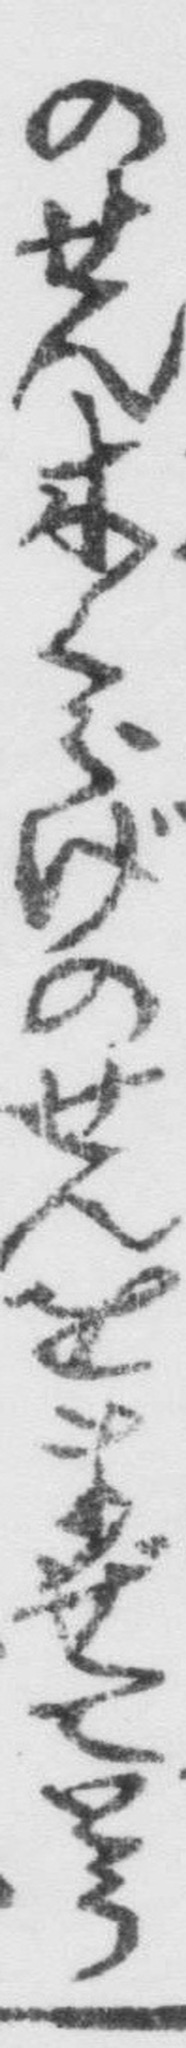のせん木くらげのせんをまぜてとう
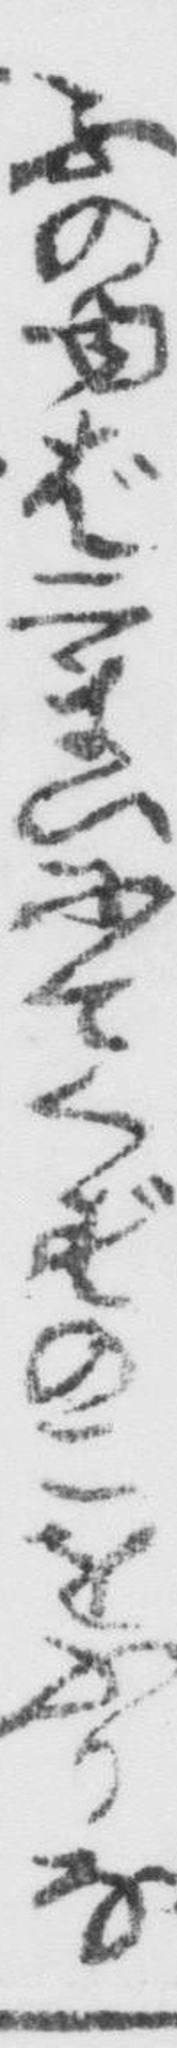ふのゆばニまひにてくずのこをふりな
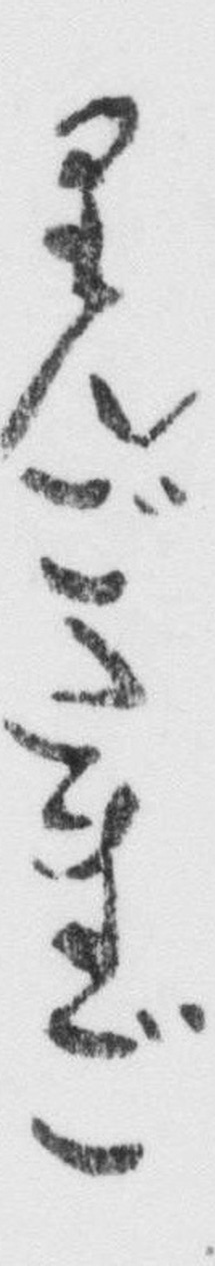りんごたまご
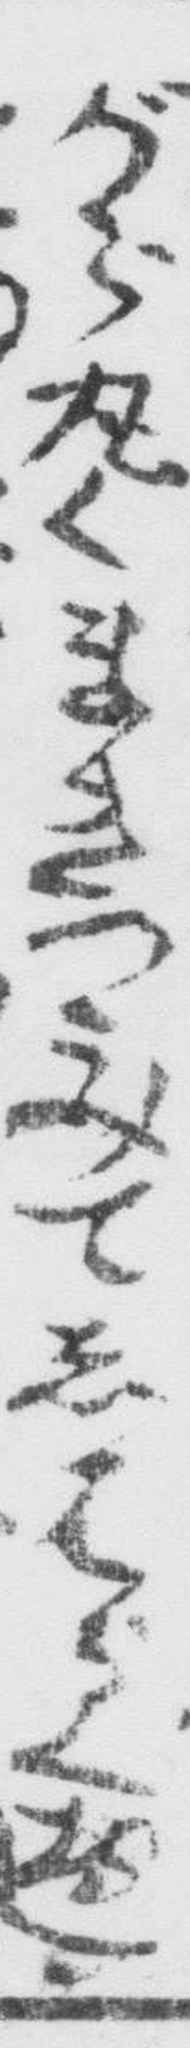がら丸くまきつゝみてしはらくし
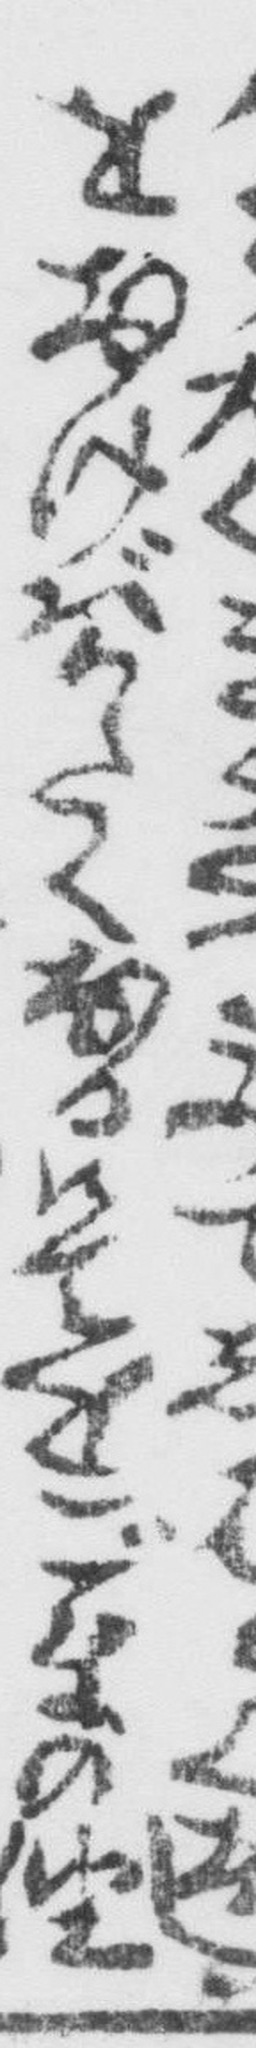をけバかたくなるにてごまの油
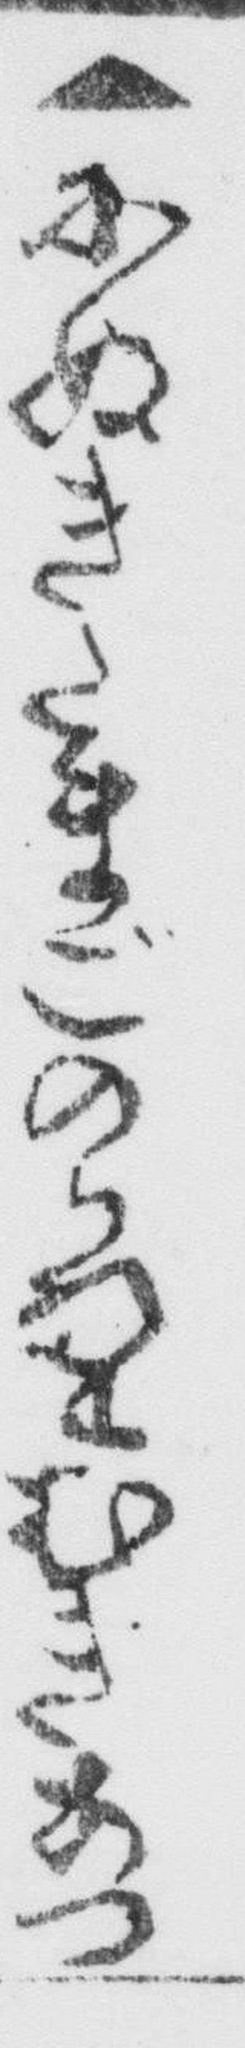▲にぬきたまごのかハをむきあつ
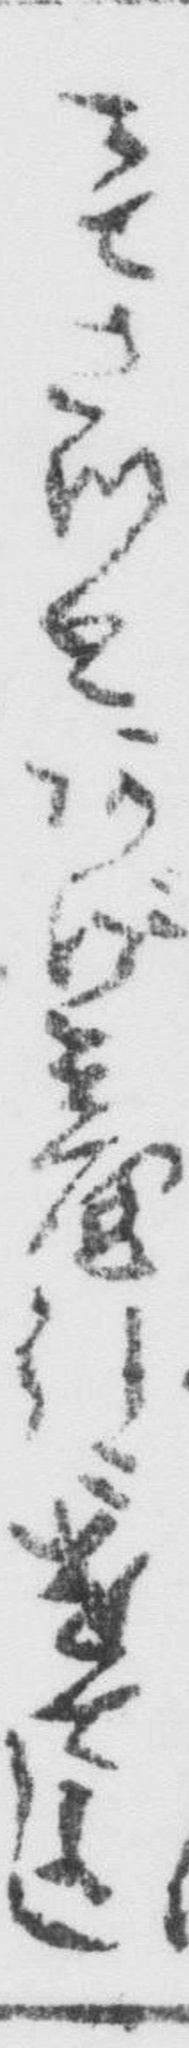にてさつとあげ引に遣てよし
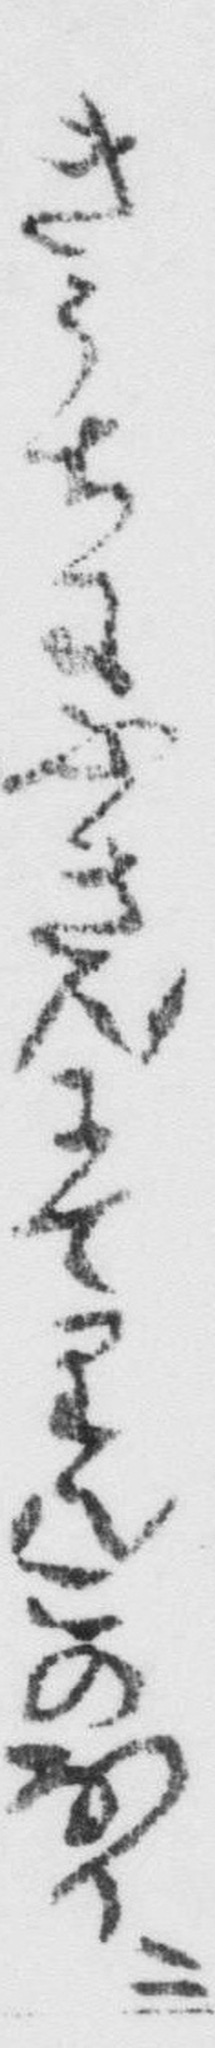きうちにふきんにてりんこのなりニ
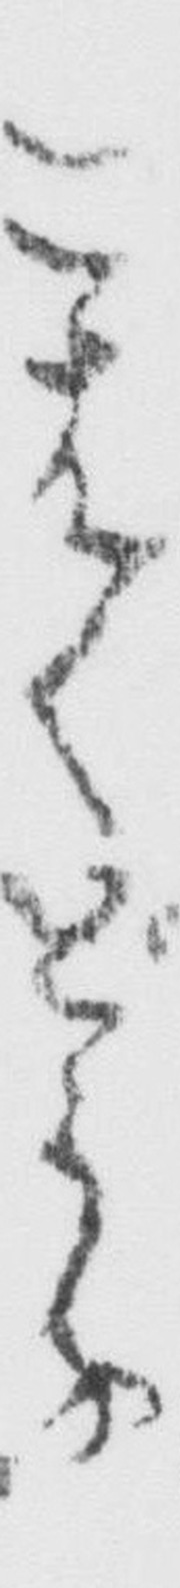こはくどうふ
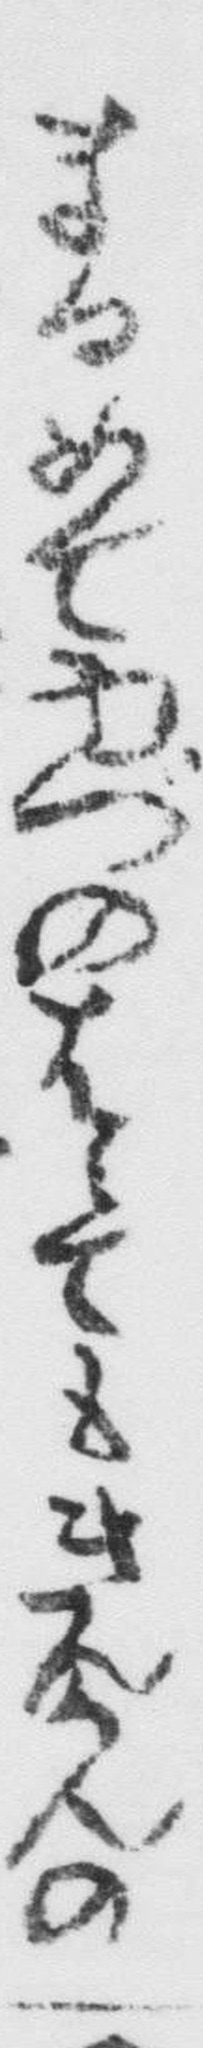まるめてゆづのはてもきんかんの
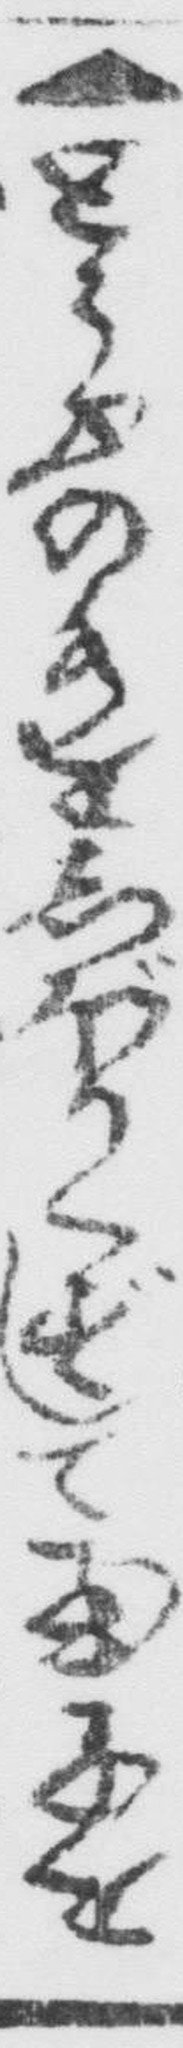▲とうふの水をしぼおりくずして玉子を
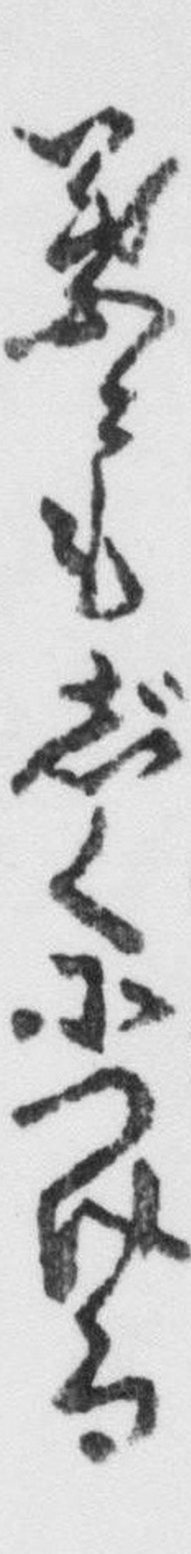葉てもぢくにつける
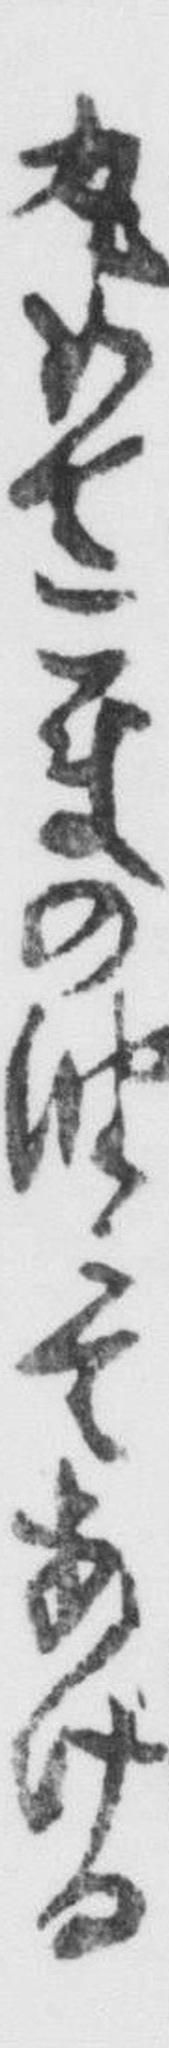丸めてこまの油にてあげる
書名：即席料理/早指南
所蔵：大阪府立大学学術情報センター 国文学研究資料館
